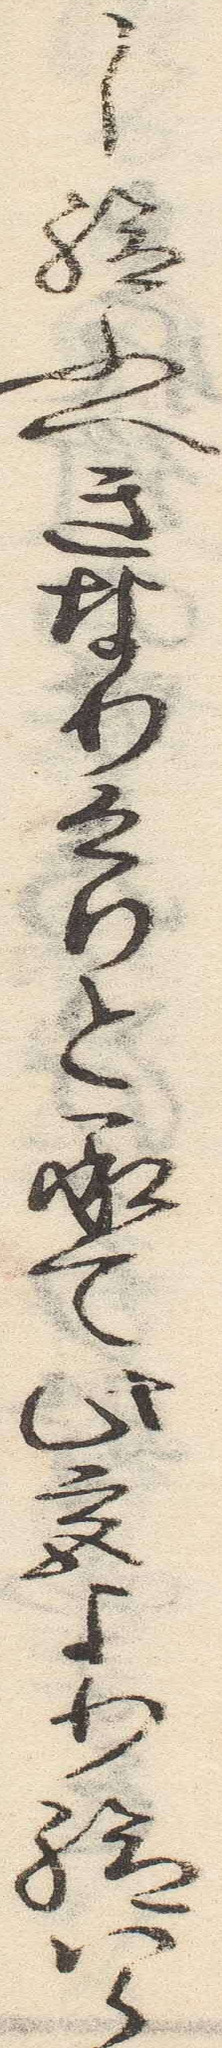し給ふへきなりけりと承て此宮より給はら
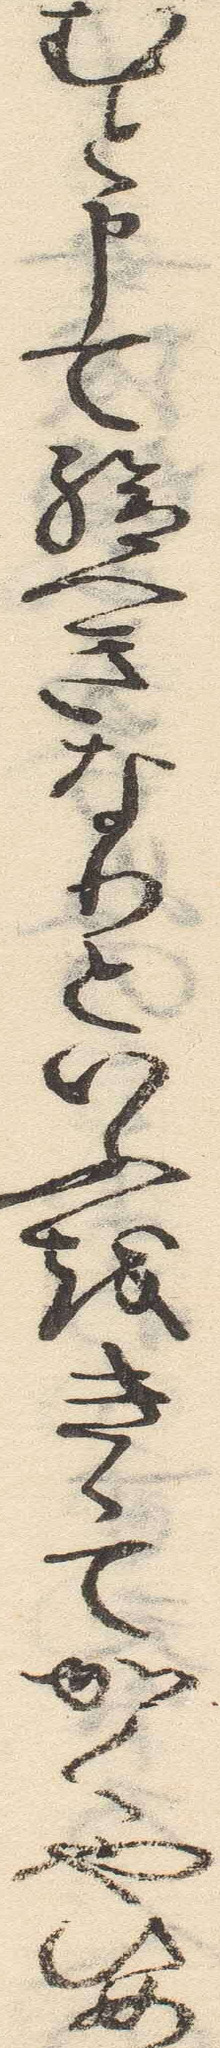むと申て給へきなりといふをきゝてかくやひめ
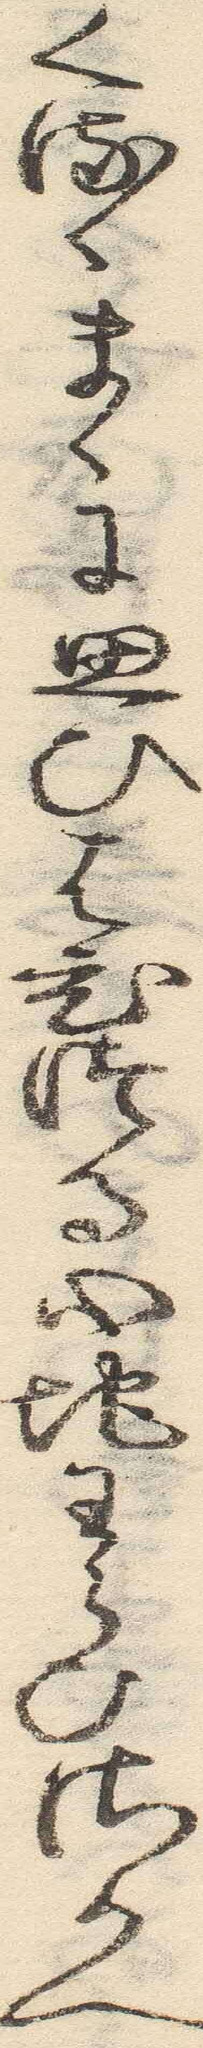くるゝまゝに思ひはひつる心地わらひさかへ
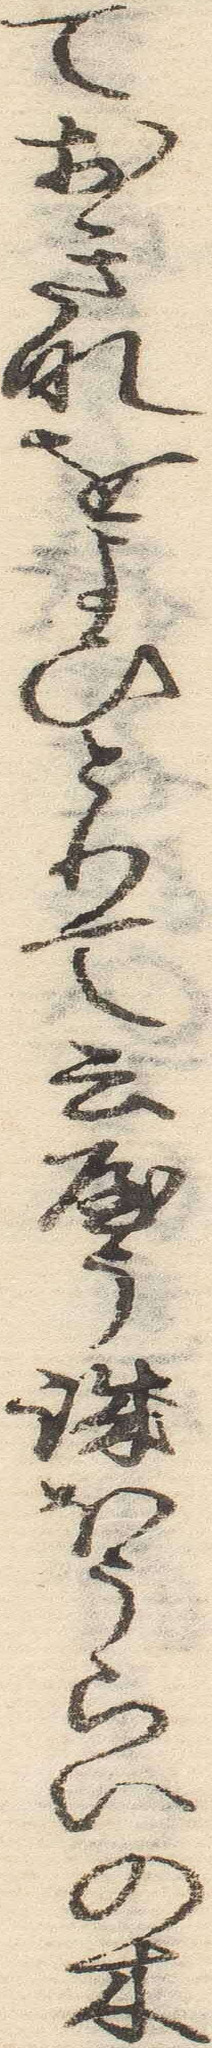ておきなをよひとりて云やう誠ほうらいの木
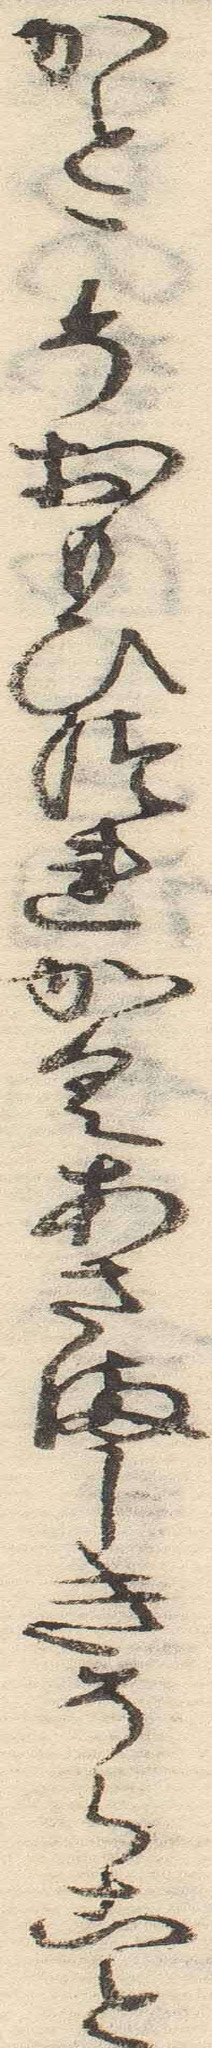かとこそおもひつれかくあさましきそらこと
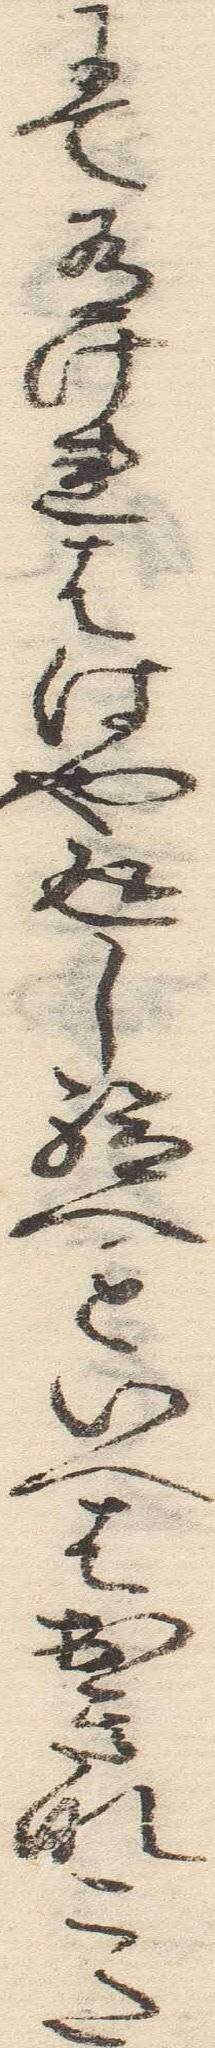にて有けれははや返し給へといへはおきなこた
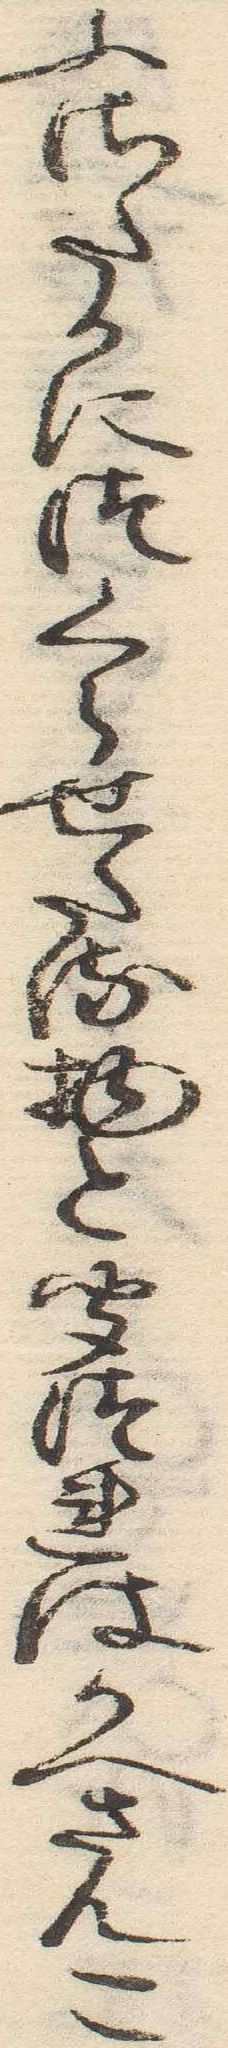ふさたかにつくらせたる物と聞つれはかへさんこ
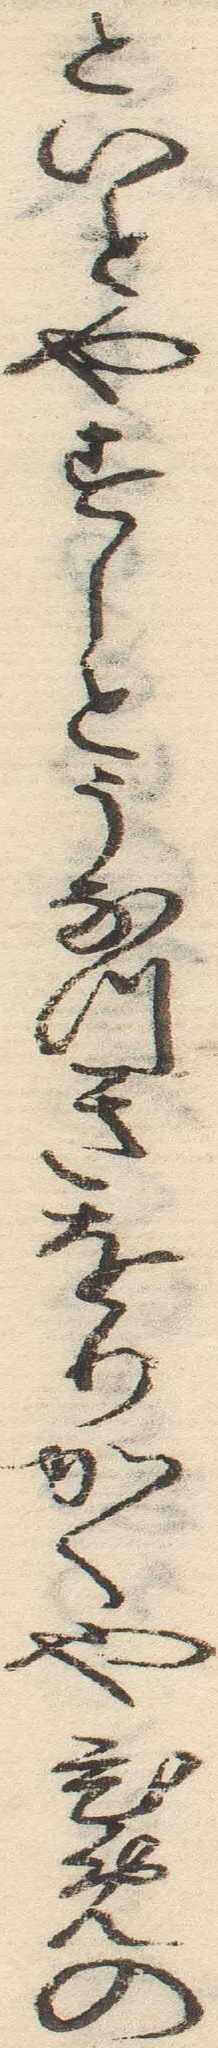といとやすしとうなつきをりかくやひめの
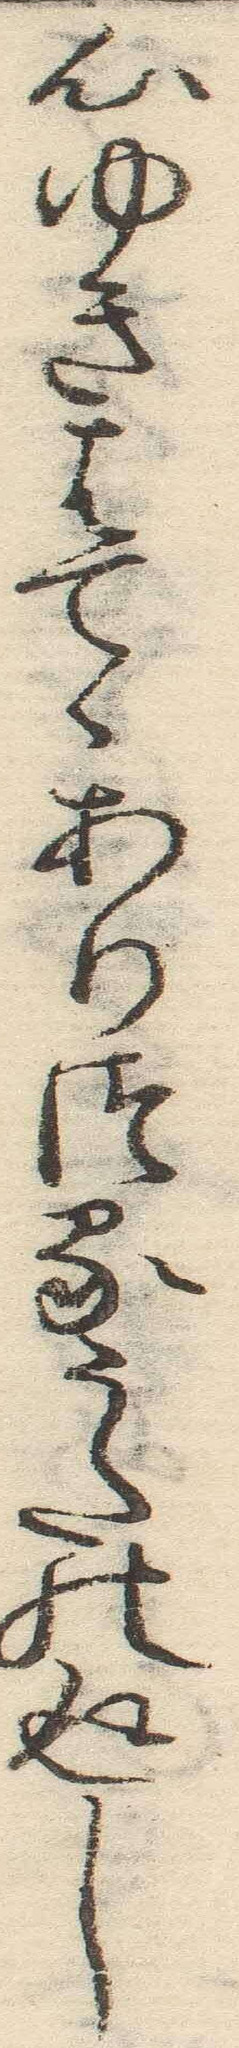心ゆきはてゝありつるうたの返し
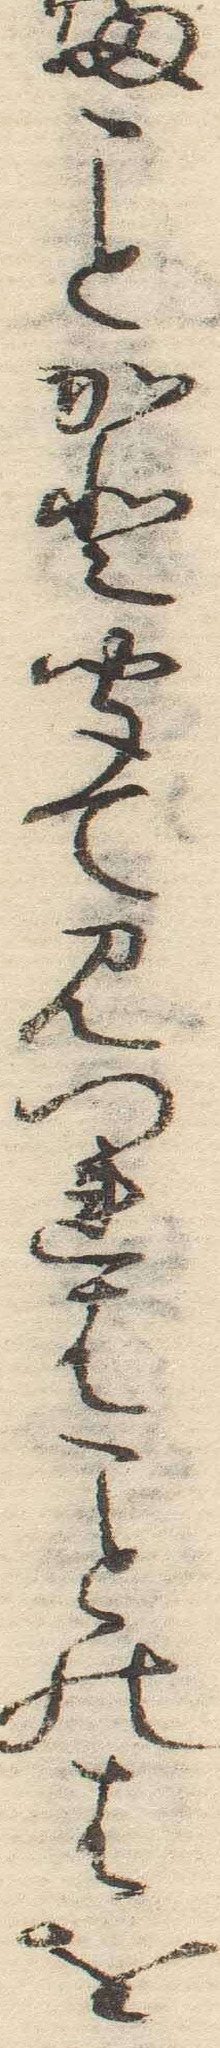まことかと聞て見つれはことのはを
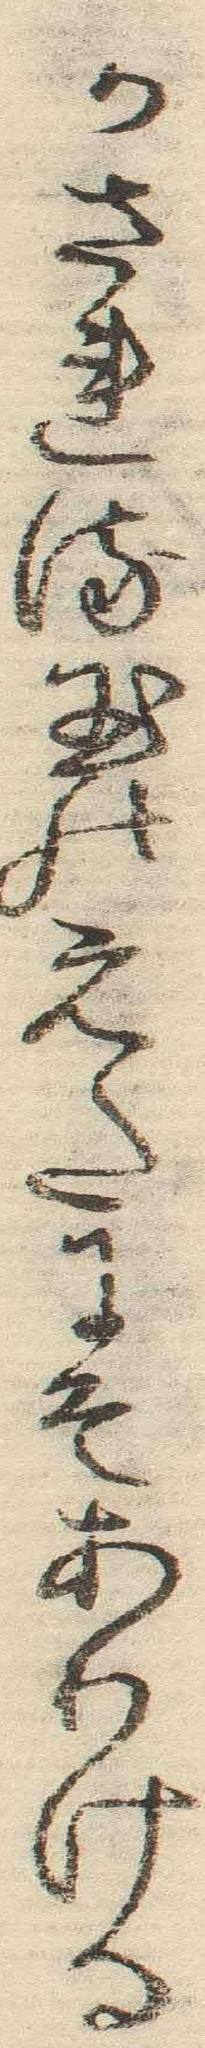かされる玉のえたにそありける
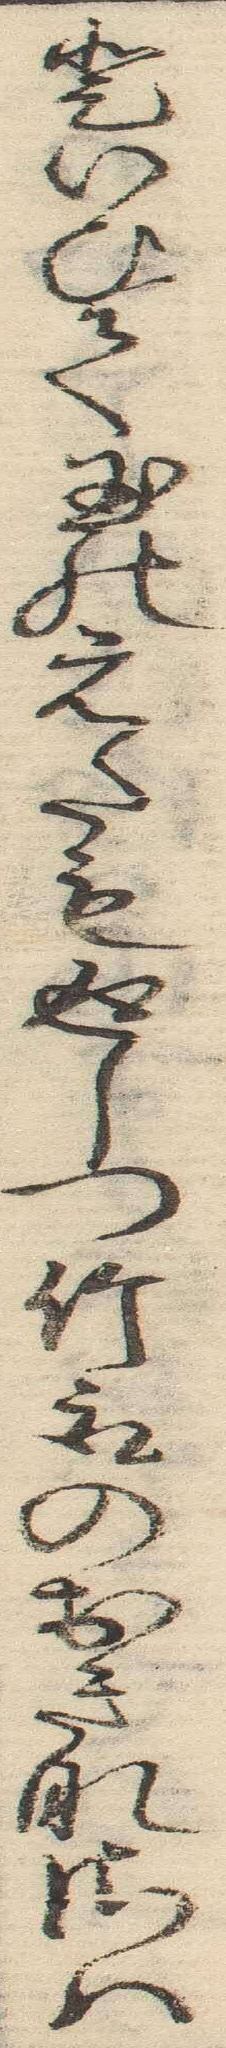といひて玉のえたも返しつ竹取のおきなさは

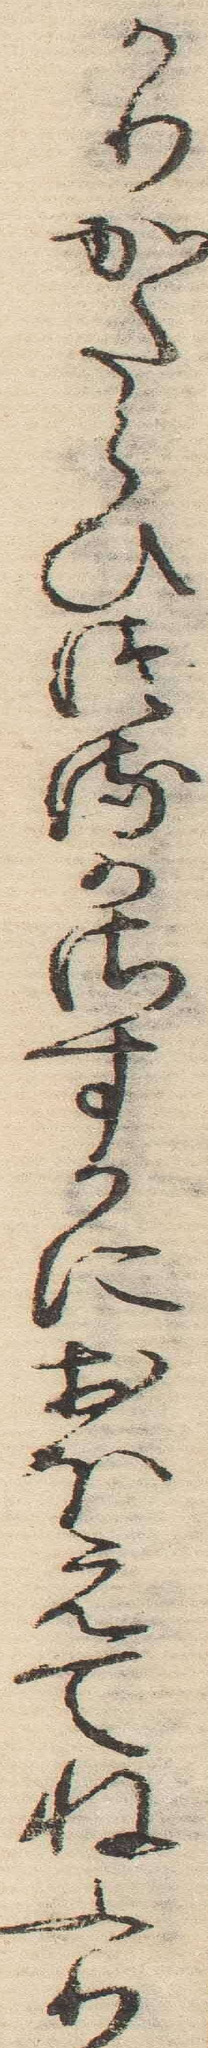かりかたらひつるかさすかにおほえてねふり
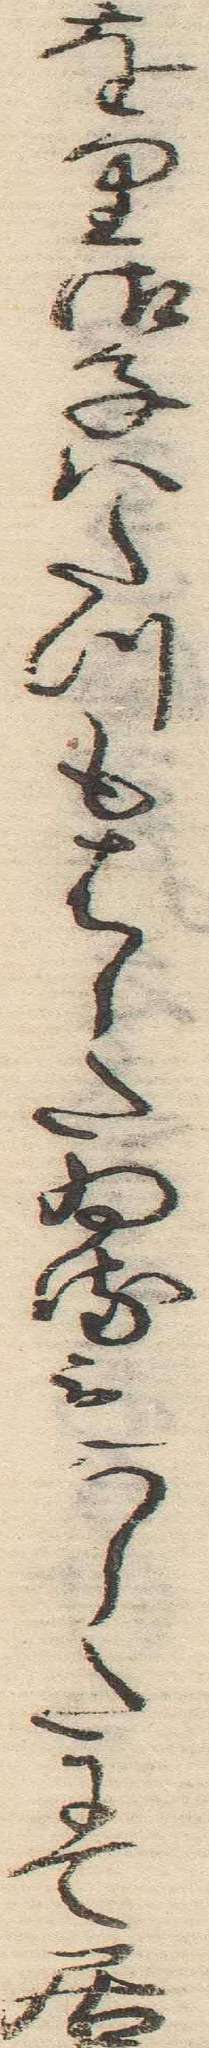をり御子はたつもはしたゐるもかしたにて居
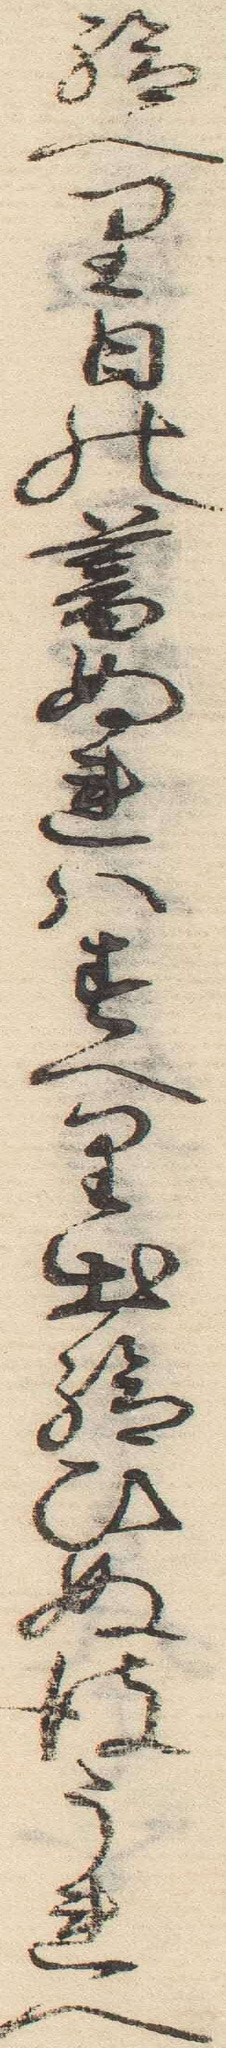給へり日の暮ぬれはすへり出給ひぬ彼うれへ
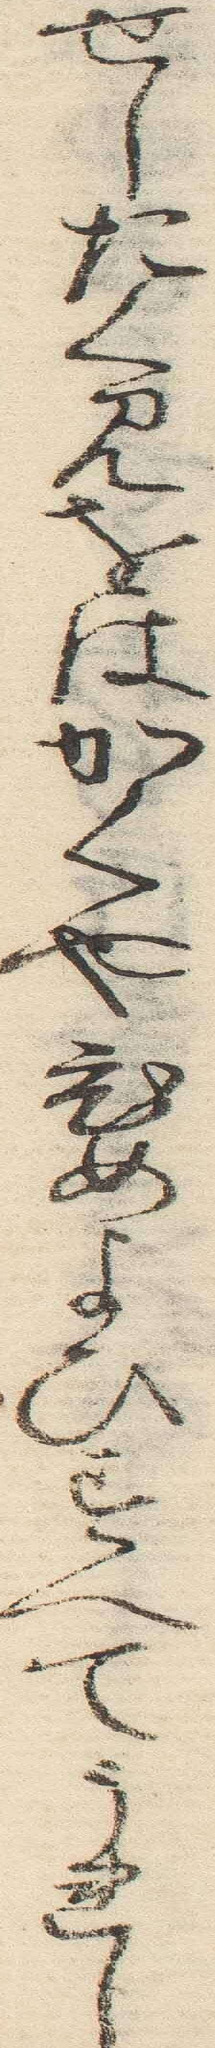せしたくみをはかくやひめよひすへてうれし
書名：竹取物語
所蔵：東京学芸大学附属図書館 国文学研究資料館
